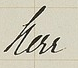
Herr u
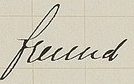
Beiliegend
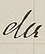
Note.
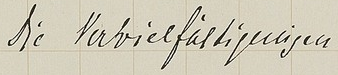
Die Vervielfältigungen
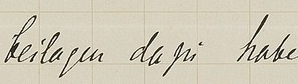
Beilagen dazu habe
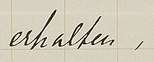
erhalten,
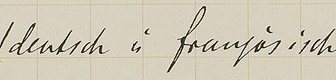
(deutsch u französisch) die
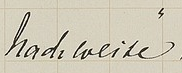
«Nachweise».
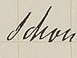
Zahl von
